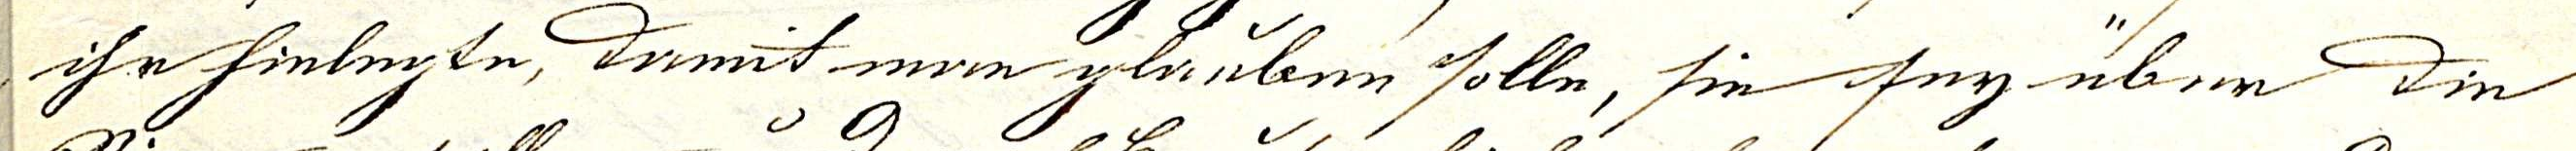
ihr hinlegte, damit man glauben solle, sie sey über die
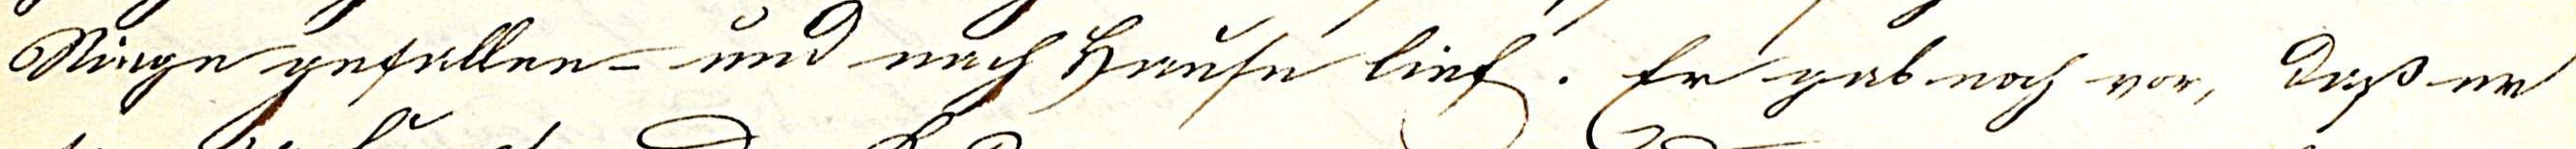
Stiege gefallen – und nach Hause lief. Er gab noch vor, daß er
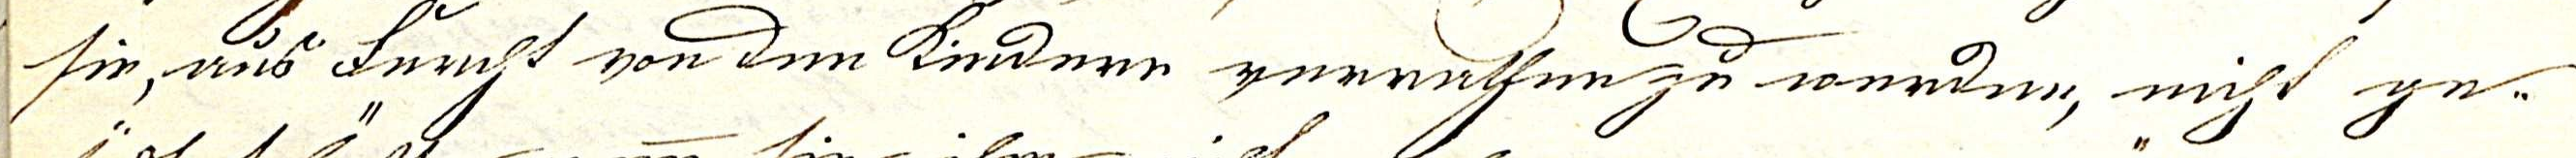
sie, aus Furcht von den Kindern verrathen zu werden nicht ge¬
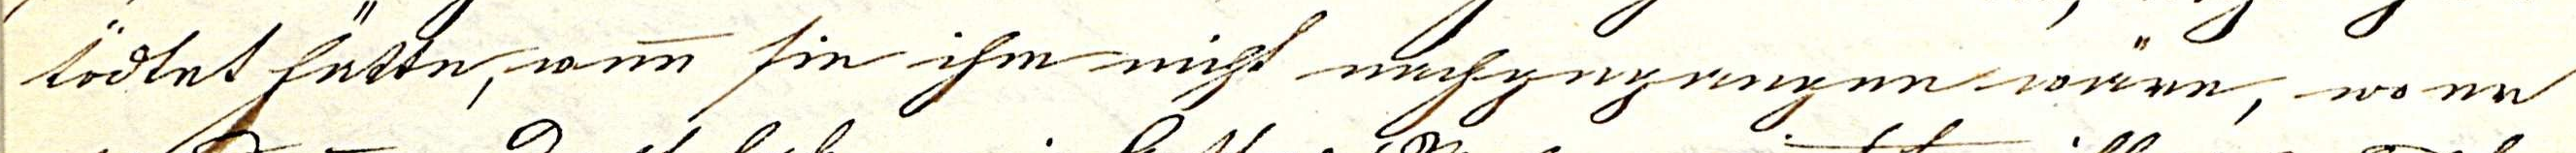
tödtet hätte, wenn sie ihm nicht nachgegangen wäre, wo er
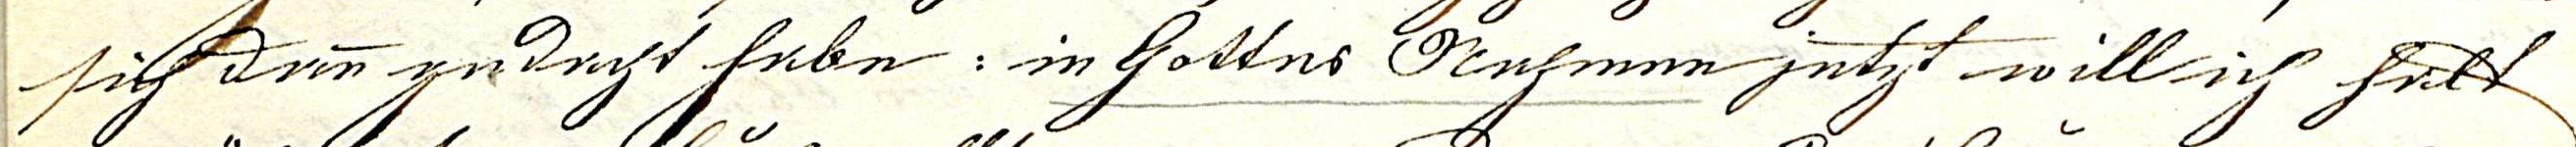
sich dann gedacht habe: in Gottes Nahmen jetzt will ich halt
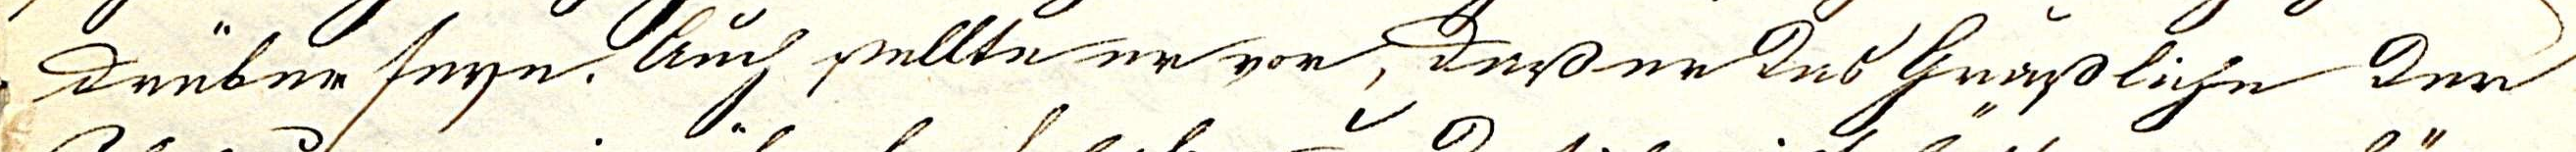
drüber seyn. Auch stellte er vor, daß er das Gräßliche der
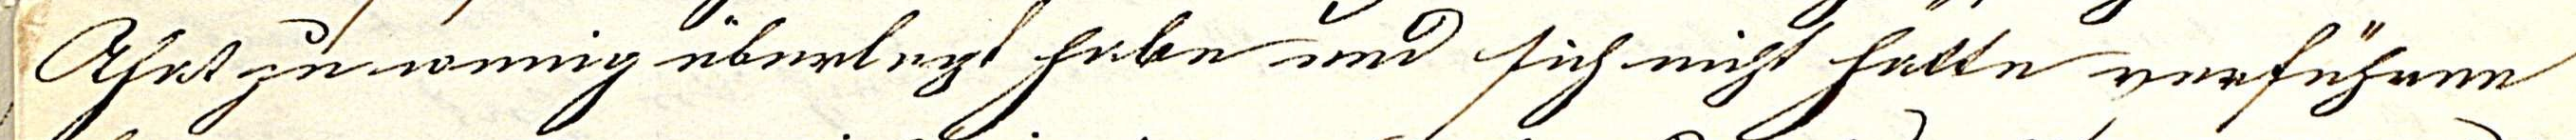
That zu wenig überlegt habe und sich nicht hätte verführen
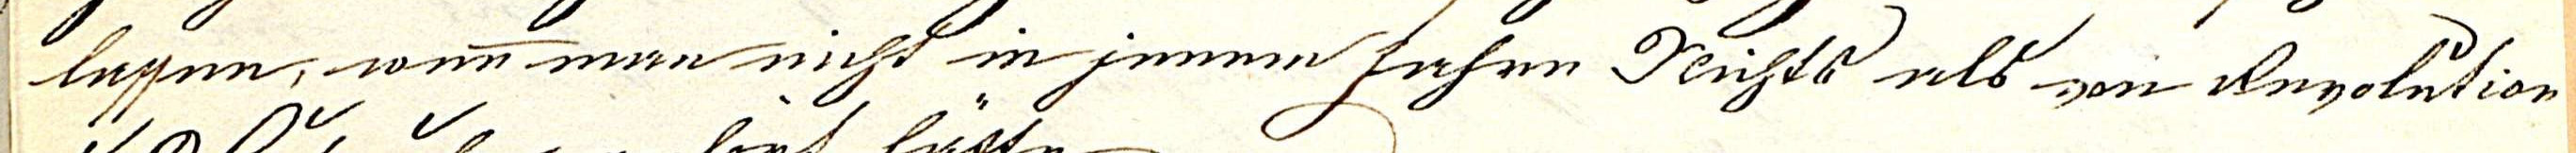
lassen, wenn man nicht in jenen Jahre Nichts als von Revolution
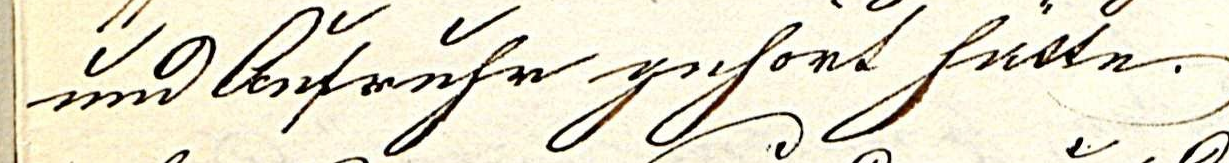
und Aufruhr gehört hätte.
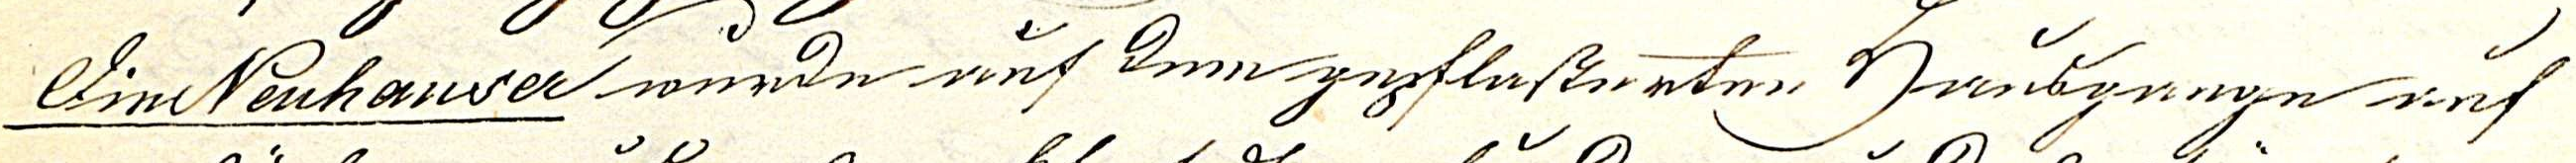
Die Neuhauser wurde auf dem gepflasterten Hausgange auf
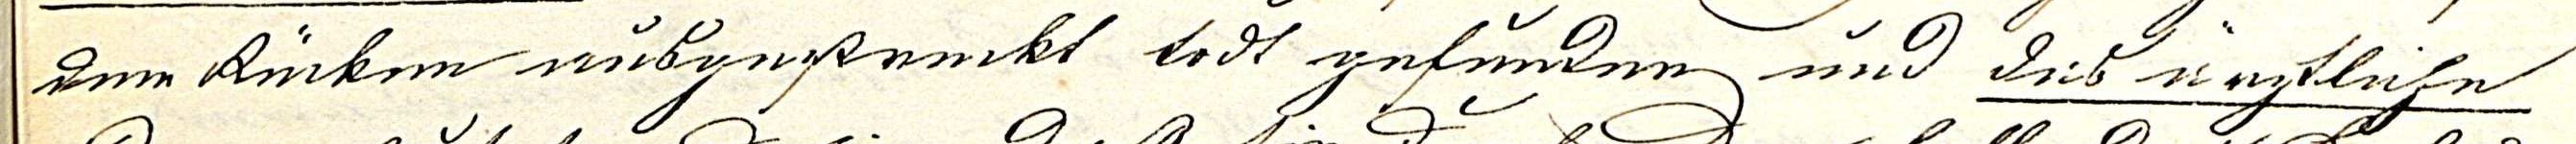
dem Rücken ausgestreckt todt gefunden und das ärztliche
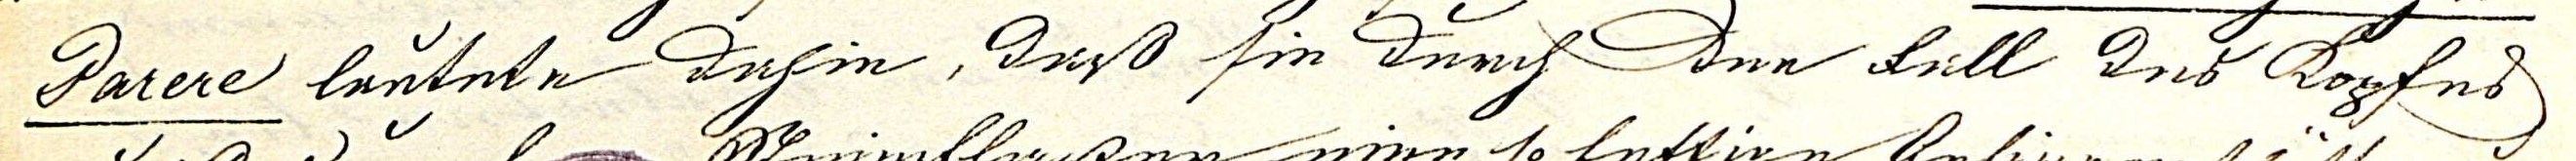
Parere lautete dahin, daß sie durch den Fall des Kopfes
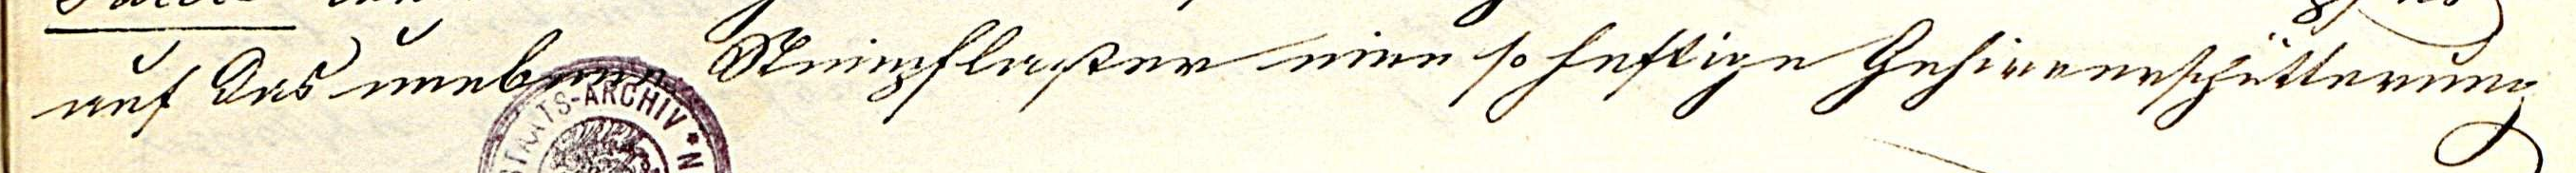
auf das unebene Steinpflaster eine so heftige Gehirnerschütterung
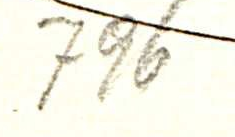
796
